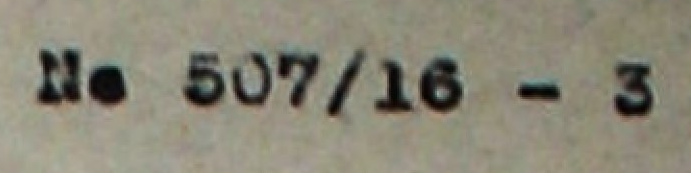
No 507/16 - 3
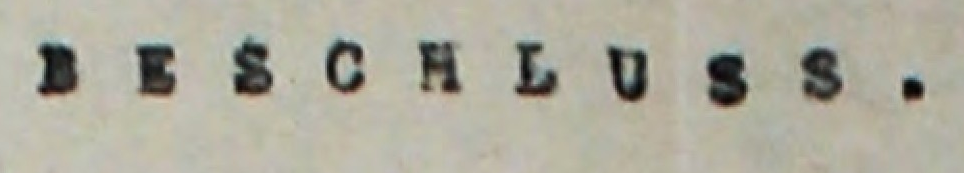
BESCHLUSS.
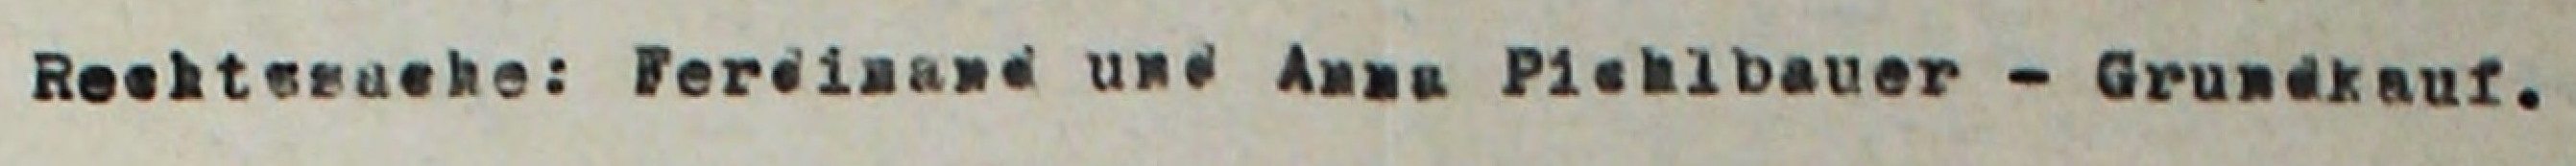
Rechtssache: Ferdinand und Anna Pichlbauer - Grundkauf.
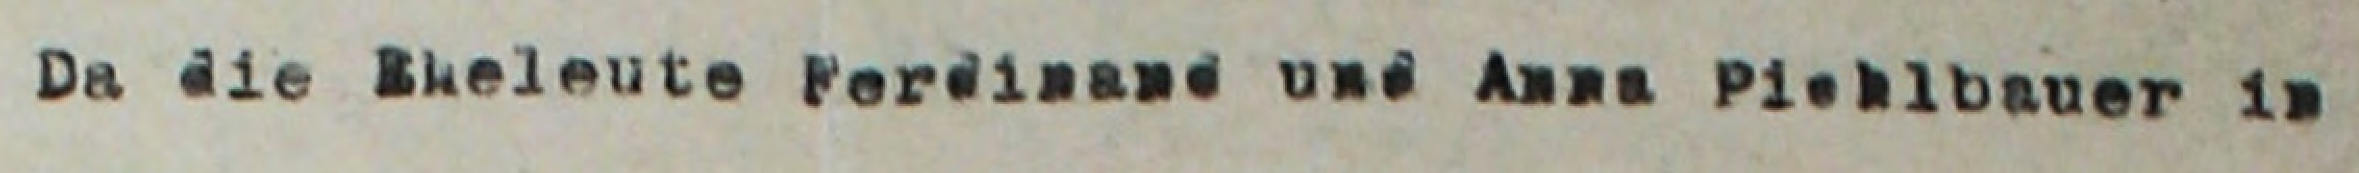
Da die Eheleute Ferdinand und Anna Pichlbauer in
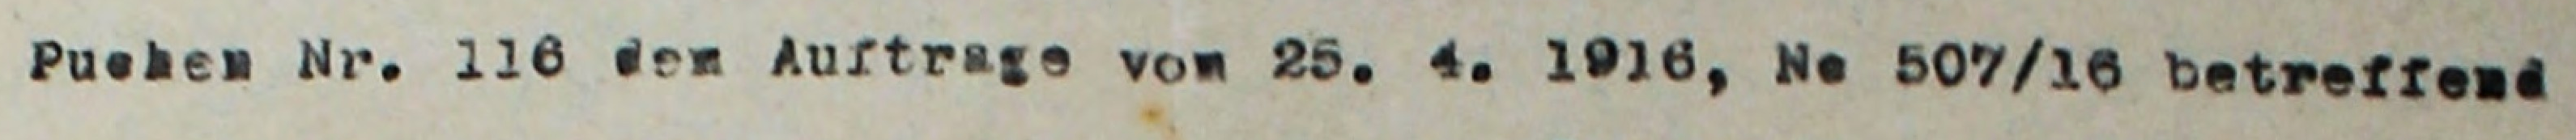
Puchen Nr. 116 den Auftrage von 25. 4. 1916, No 507/16 betreffens
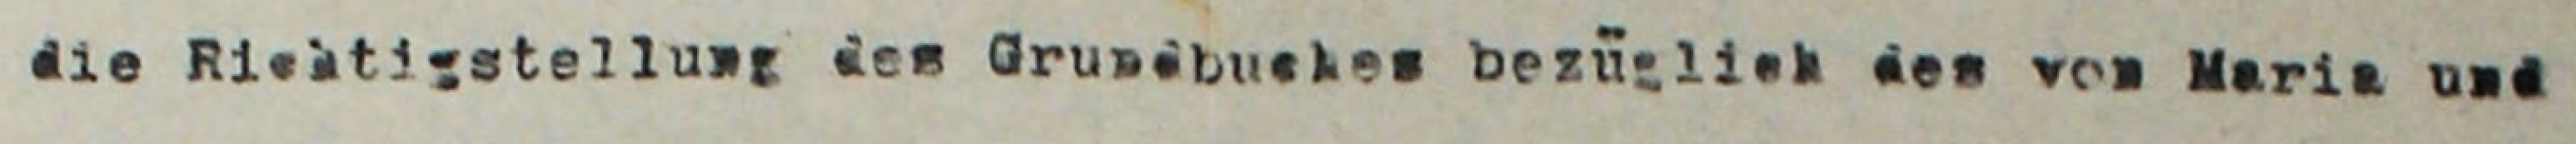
die Richtigstellung des Grundbuches bezüglich des von Maria und
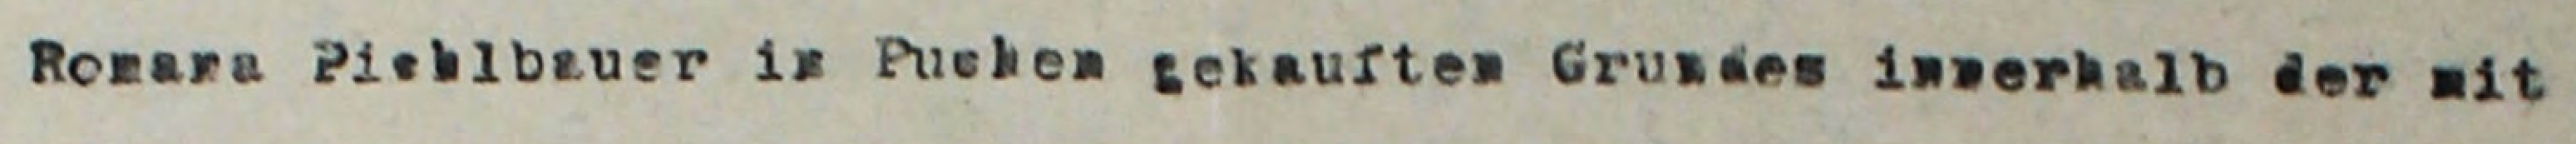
Romana Pichlbauer in Puchen gekauften Grundes lnnerhalb der mit
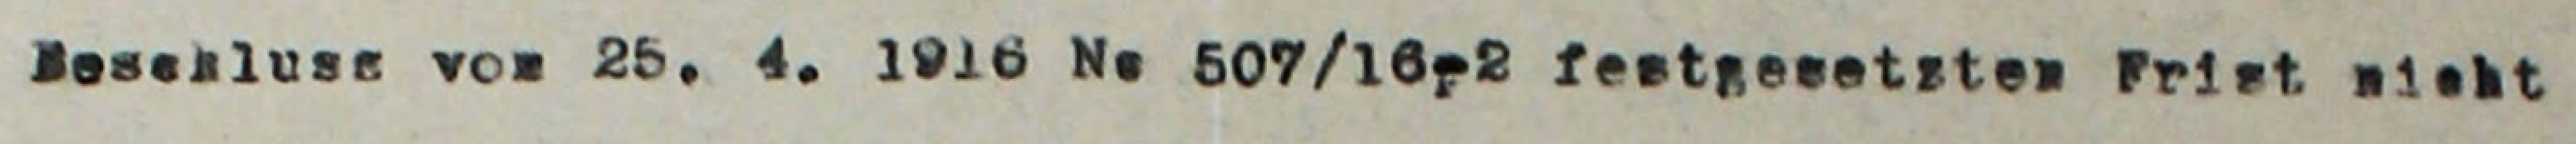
Beschluss vom 25. 4. 1916 No 507/16, 2 festgesetzen Frist nicht
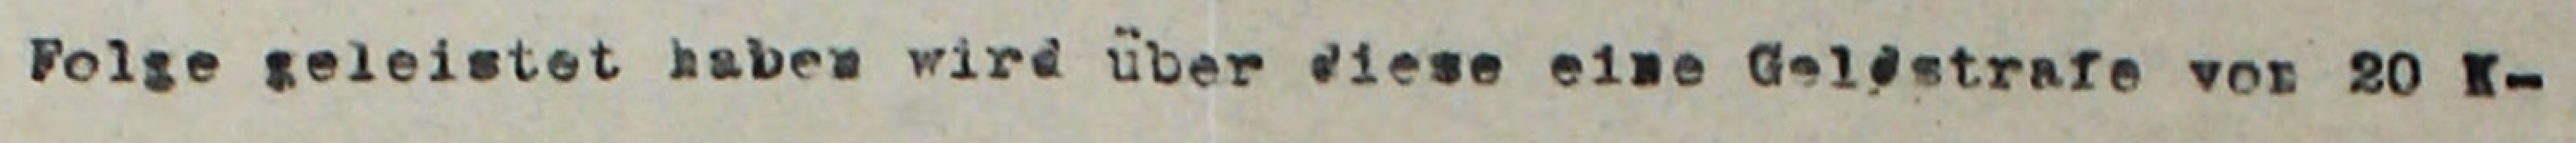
Folge geleistet haben wird über diese eine Geldstrafe von 20 K-
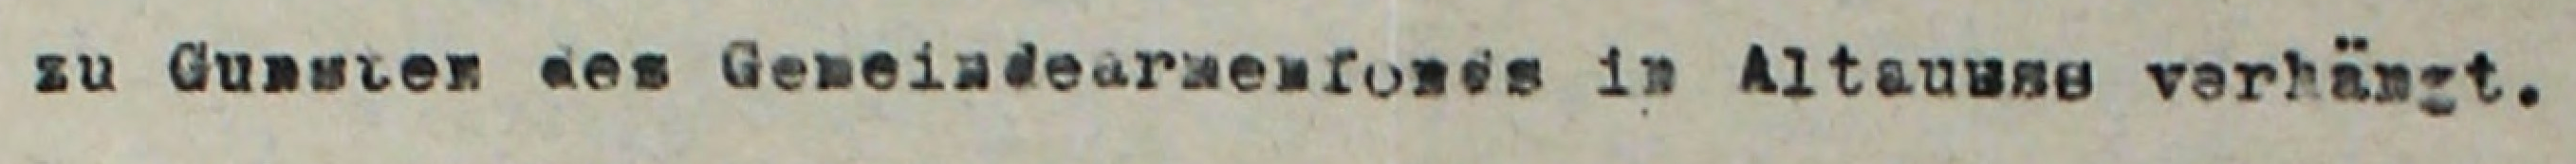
zu Gunsten des Gemeindearaerfonds in Altausse verhängt.
